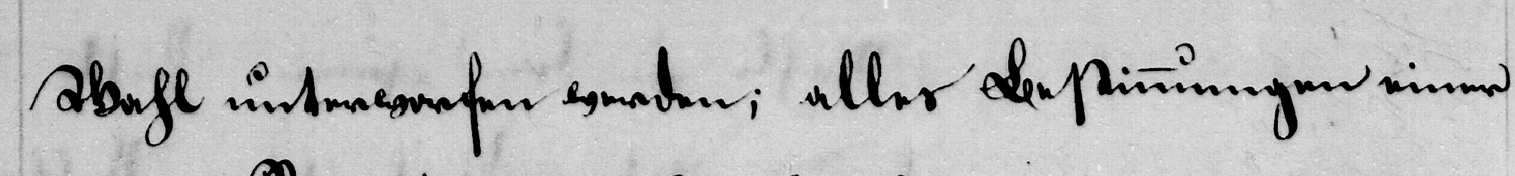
Wahl unterworfen werden; alles Bestimmungen einer
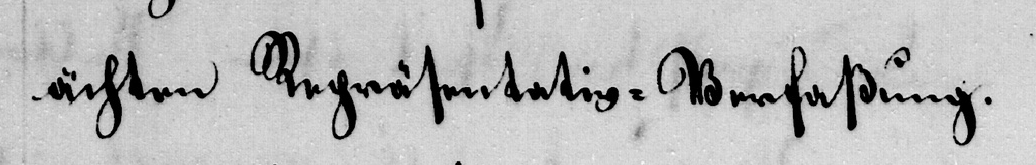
ächten Repräsentati[ons]-Verfaßung.
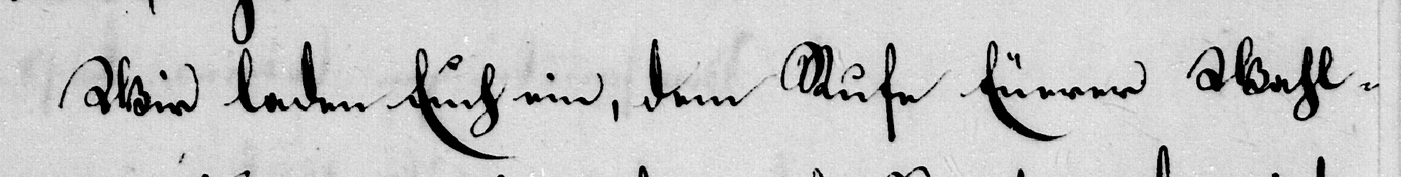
Wir laden Euch ein, dem Rufe Eurer Wahl¬
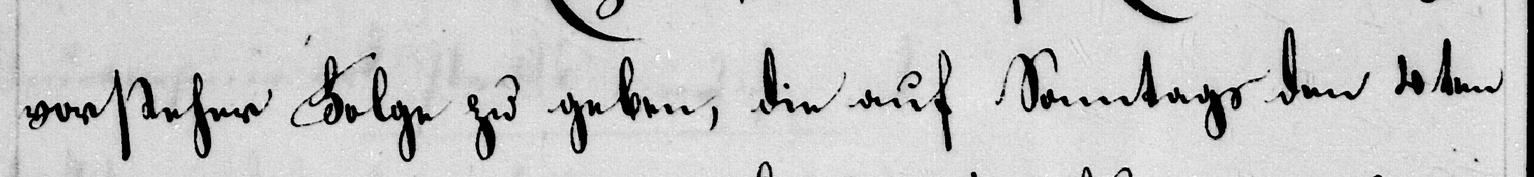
vorsteher Folge zu geben, die auf Sonntags den 4ten
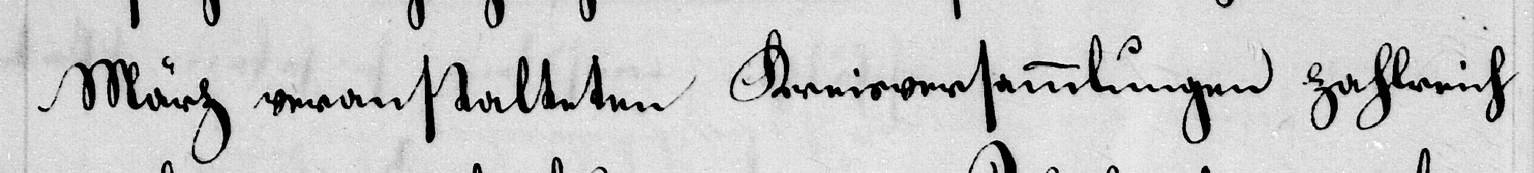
März veranstalteten Kreisversammlungen zahlreich
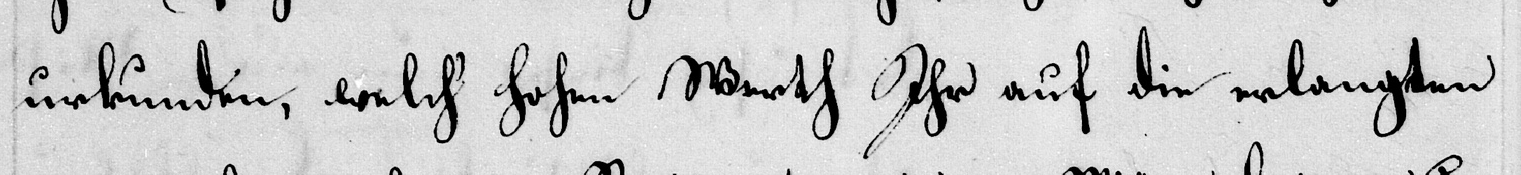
urkunden, welch hohen Werth Ihr auf die erlangten
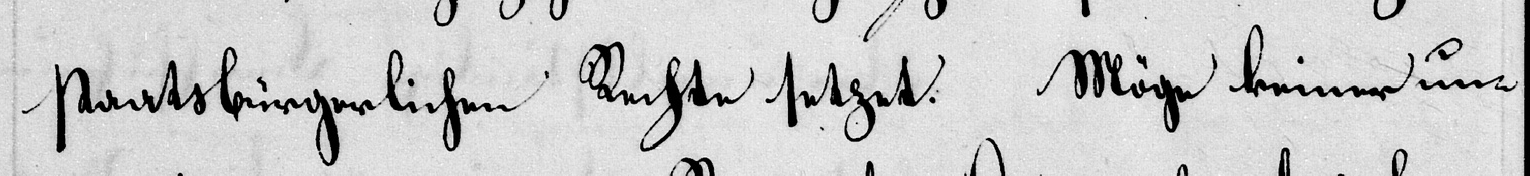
staatsbürgerlichen Rechte setzet. Möge keiner un¬
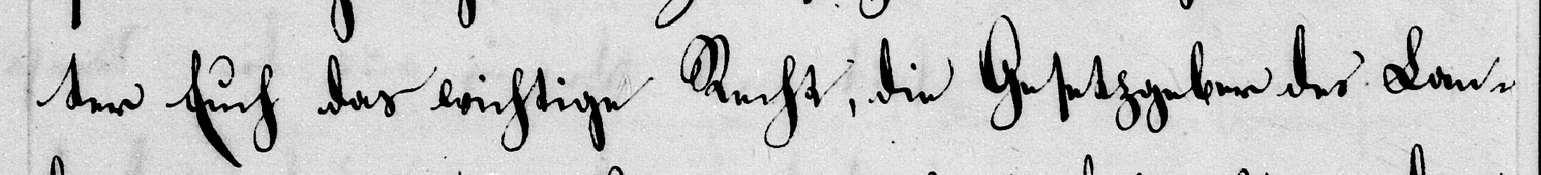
ter euch das wichtige Recht, die Gesetzgeber des Lan¬
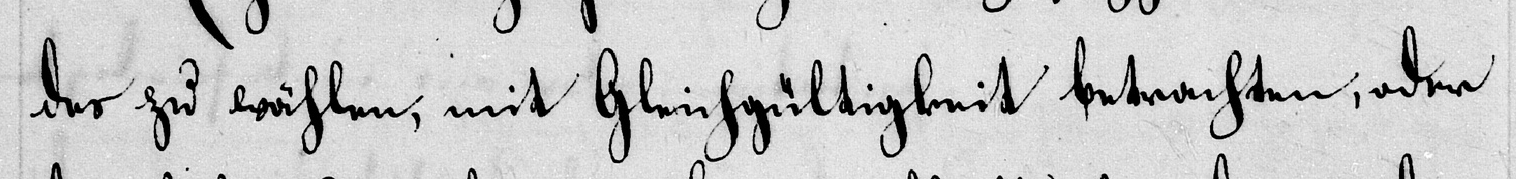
des zu wählen, mit Gleichgültigkeit betrachten, oder
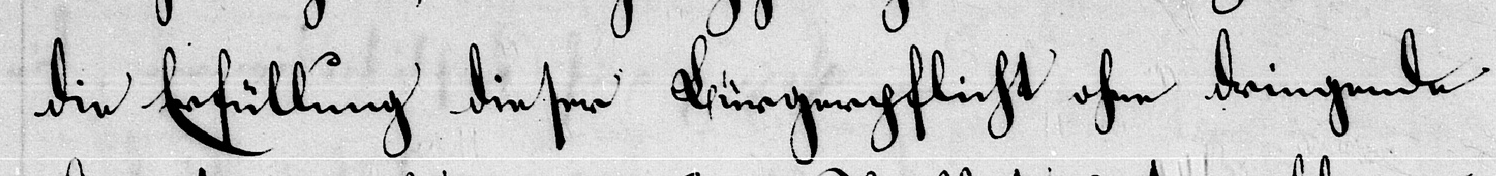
die Erfüllung dieser Bürgerpflicht ohne dringende
